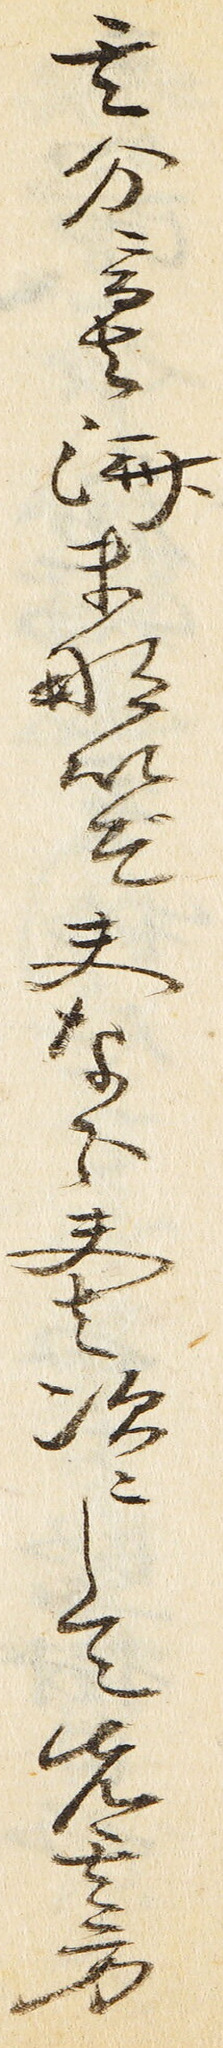其分に而は済まないぞ夫なら夫は次にして先其方
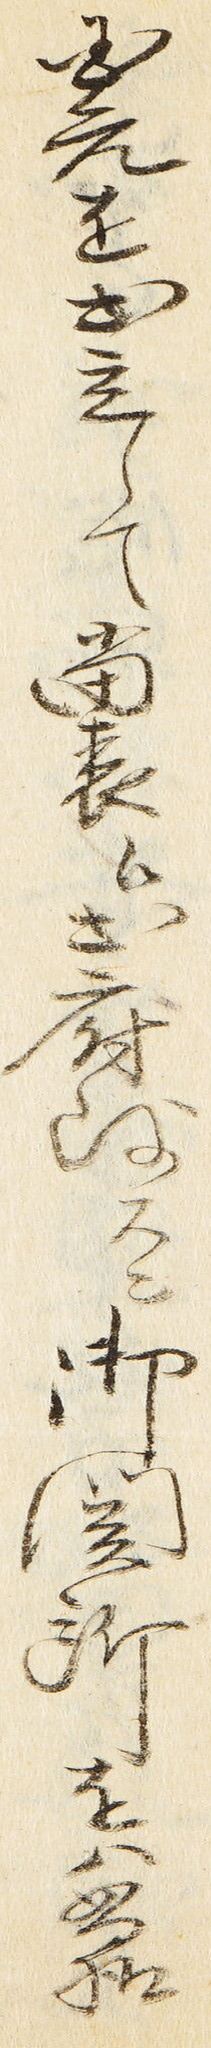国元を出立して当表江出府致スに御関所をは如何様
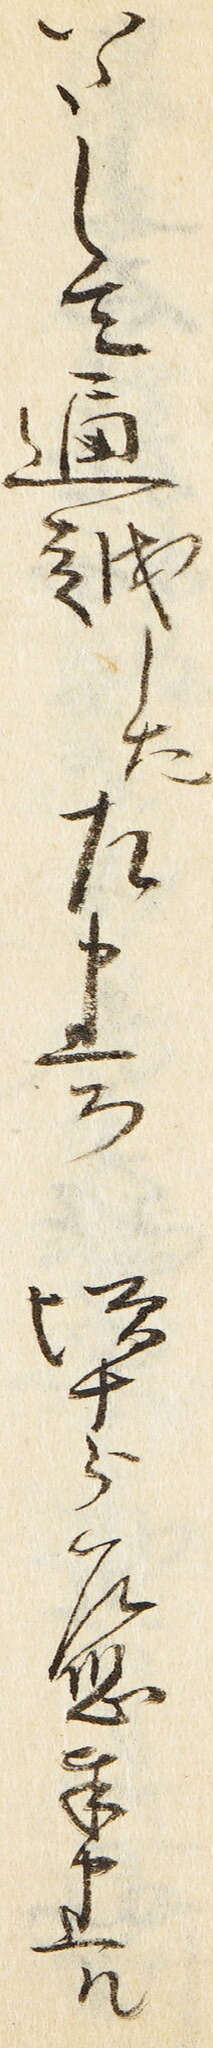いたして通越したさ申上ろ増十郎乍恐奉申上る
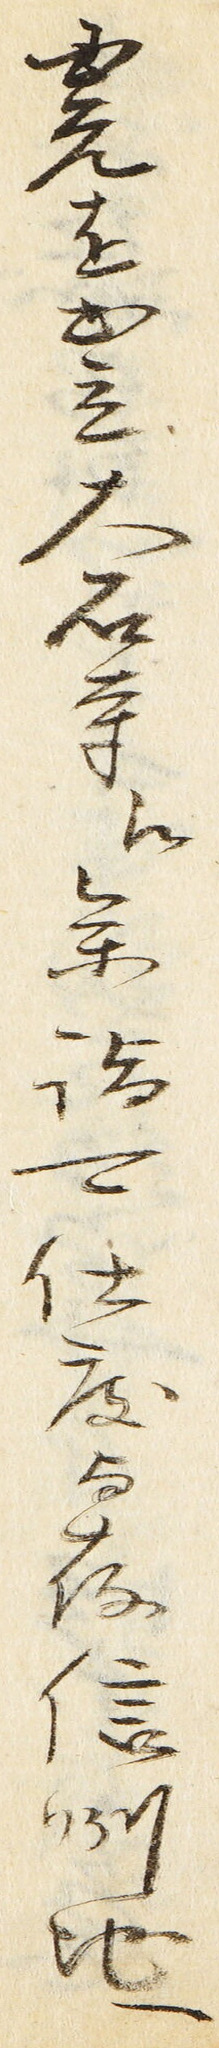国元を出立大石寺江参詣可仕度と存信州地へ
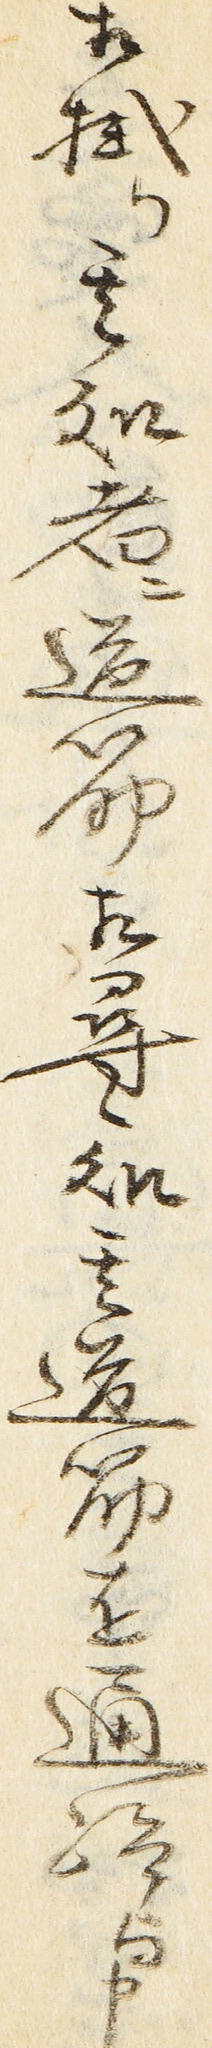相掛り其処者に道筋相尋候処其道筋を通給と申
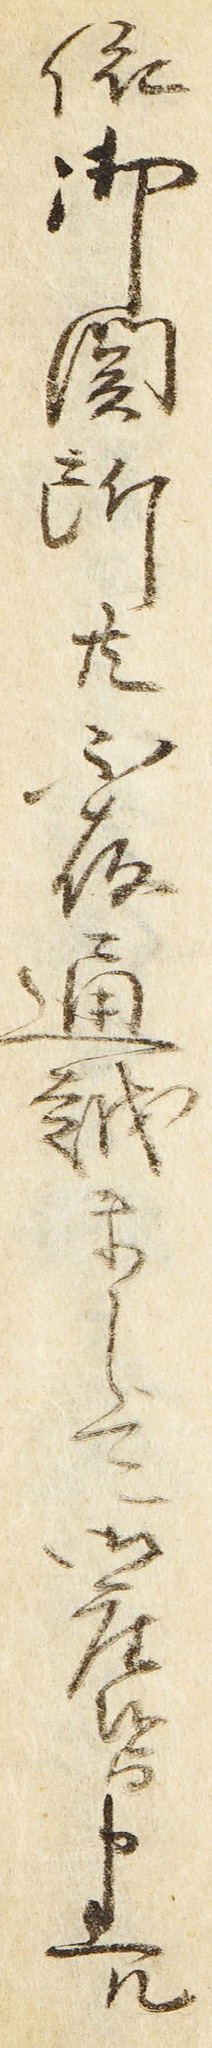依御関所共不存通越まして御座候と申上る

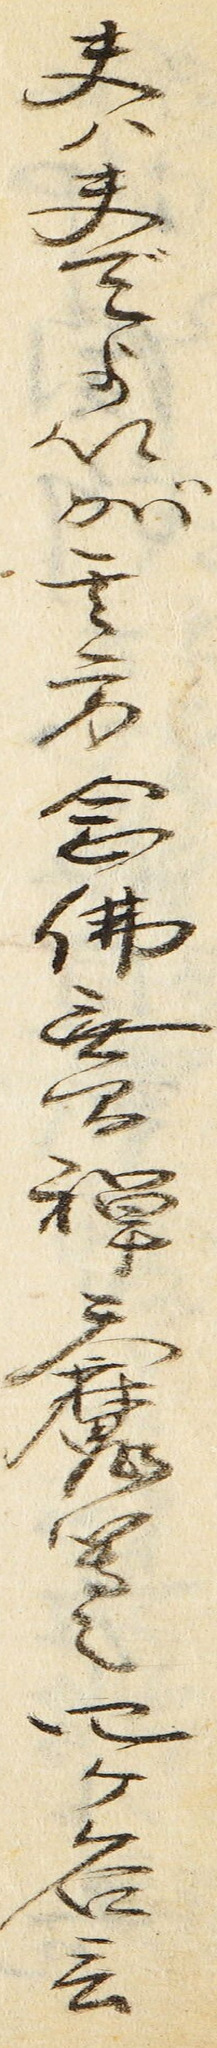夫は夫でよいが其方念佛無間禅天魔等之四ケ名言
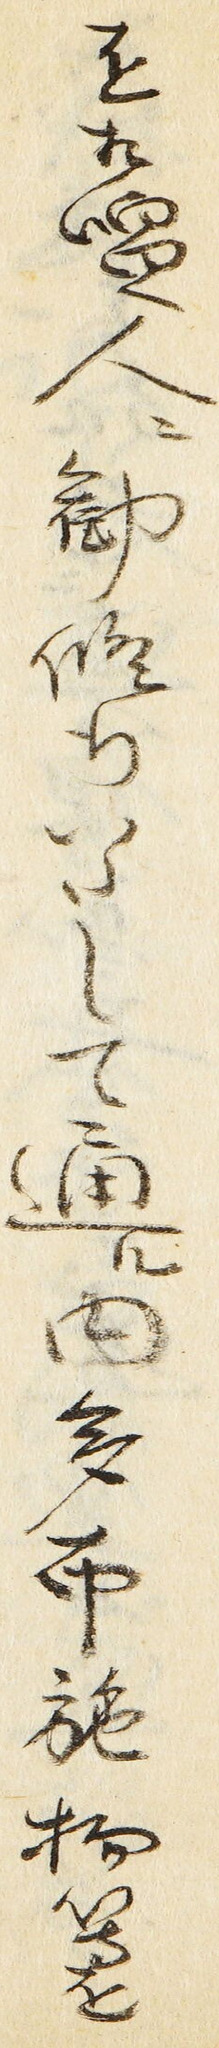を相唱人に勧修行いたして通る内多布施物等を
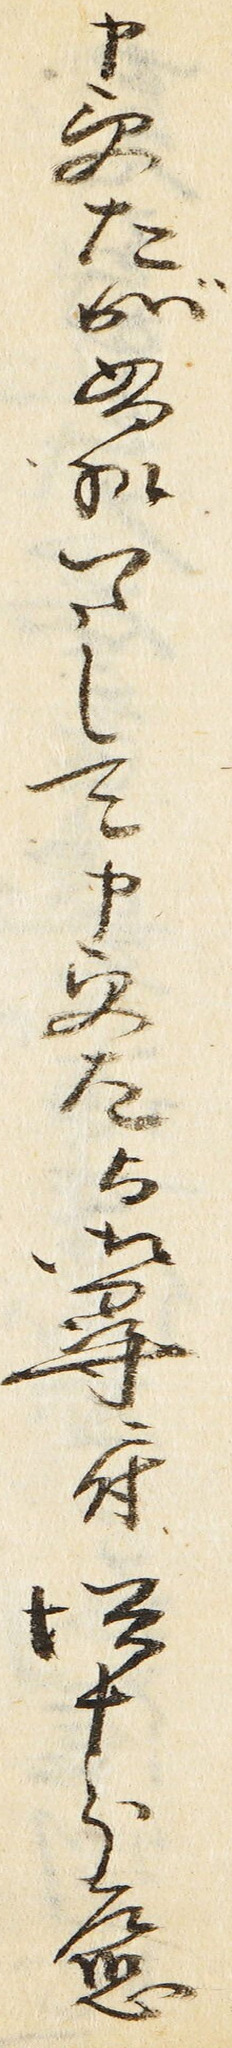申受たが如何様いたして申受たと御尋に付増十郎乍恐
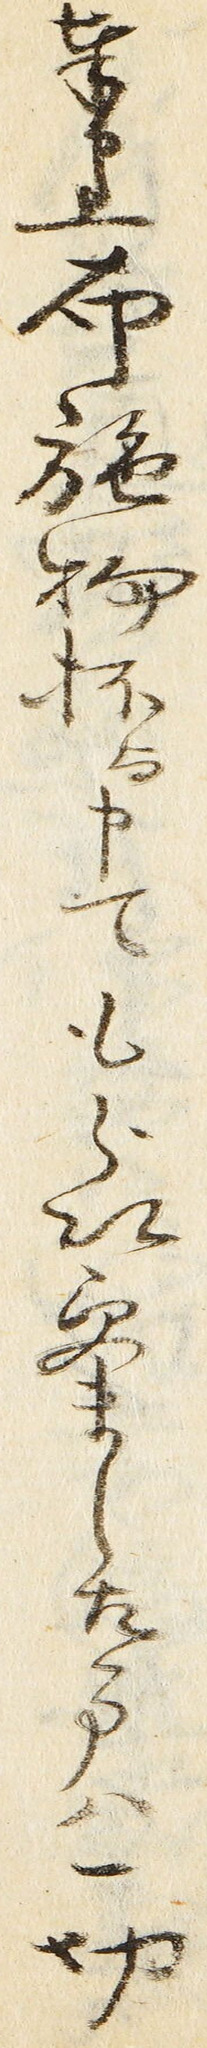奉申上布施物杯と申てもらい受ました事は一切
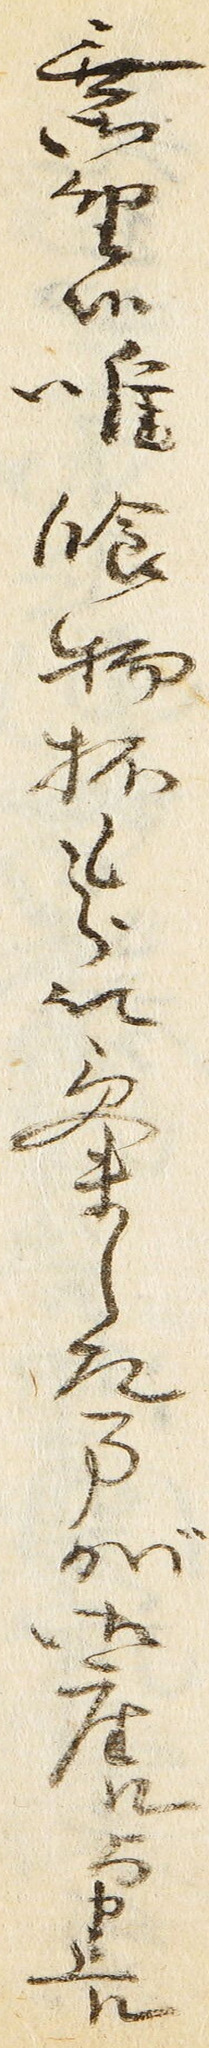無御座候唯喰物杯もらい受ました事が御座ると申上る
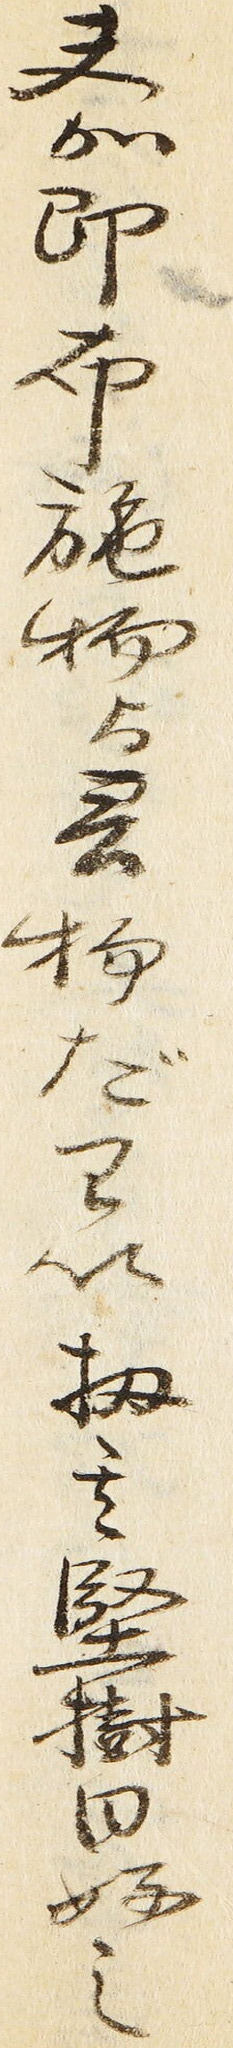夫が即布施物と言物だわい扨其堅樹日好之
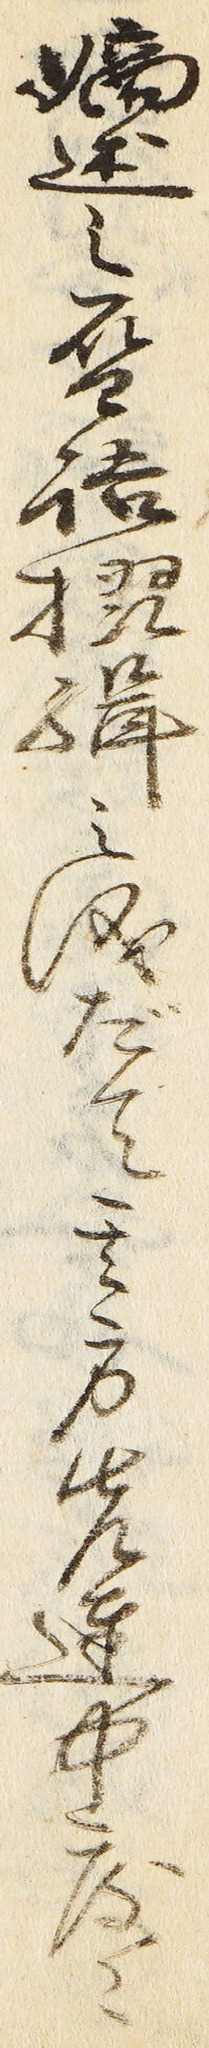嫡述之聖語撰緝の儀だて其方先達中度々
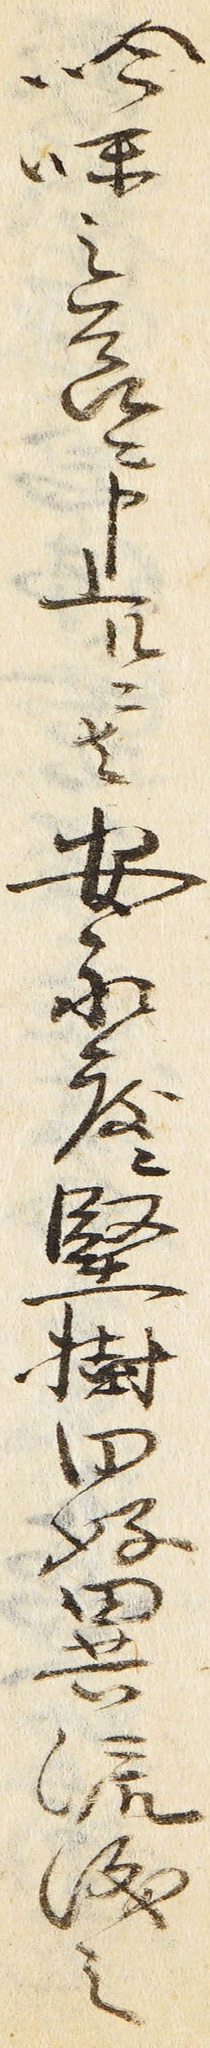吟味之節に申上るには安永度に堅樹日好異流儀之
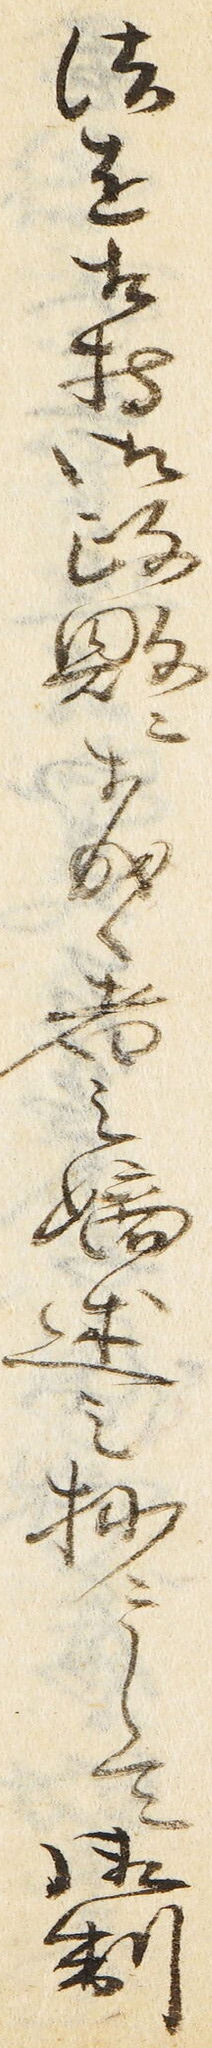法を相持御政敗に相成候者の嫡述之抄にして御制
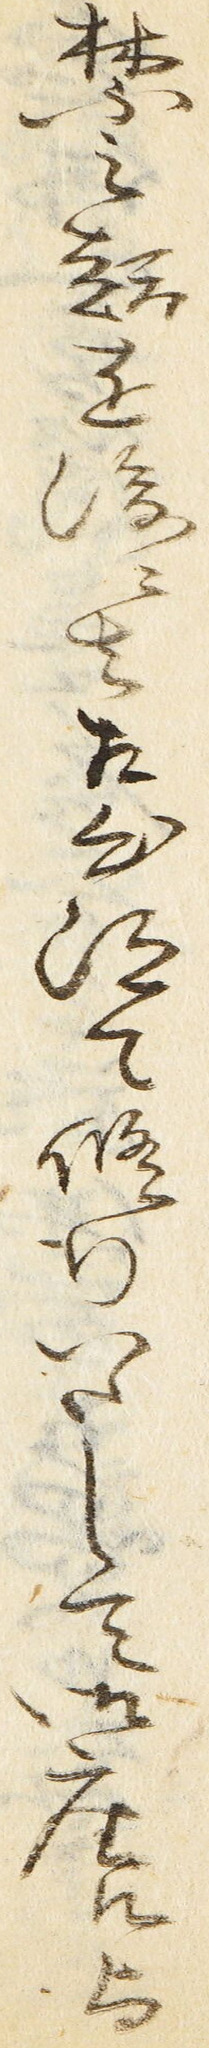禁之趣を後には相心得て修行いたして御座ると
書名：異流一件日記
